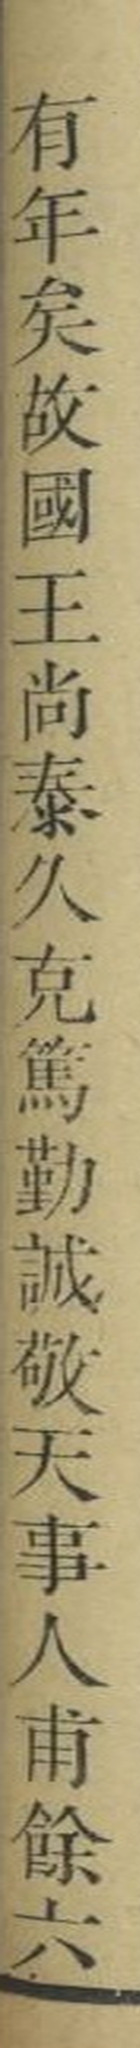有年矣故国王尚泰久克篤勤誠敬天事人甫余六
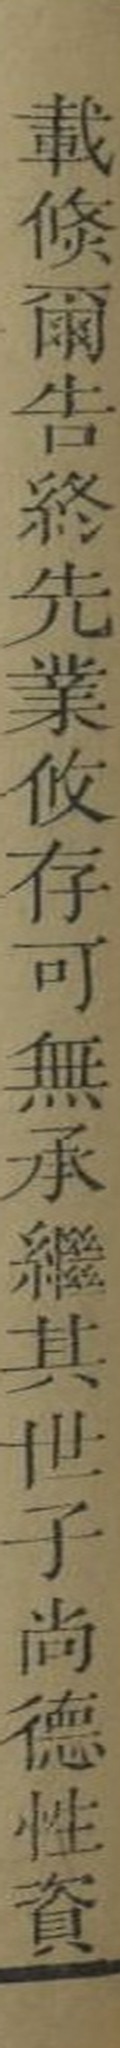載倏爾告終先業攸存可無承継其世子尚徳性資
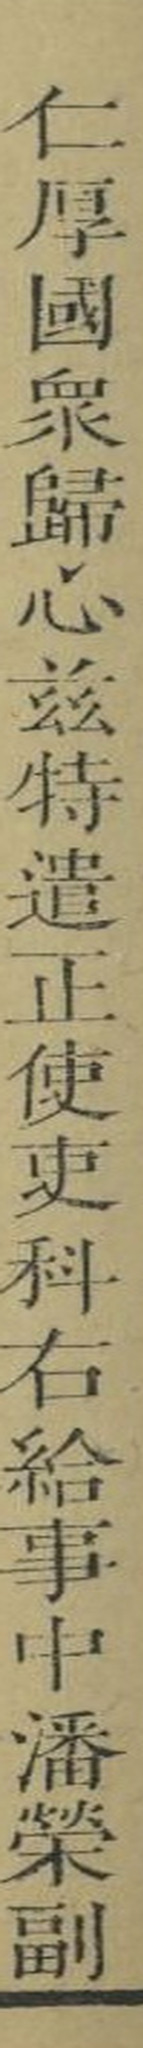仁厚国衆帰心茲特遣正使吏科右給事中潘栄副
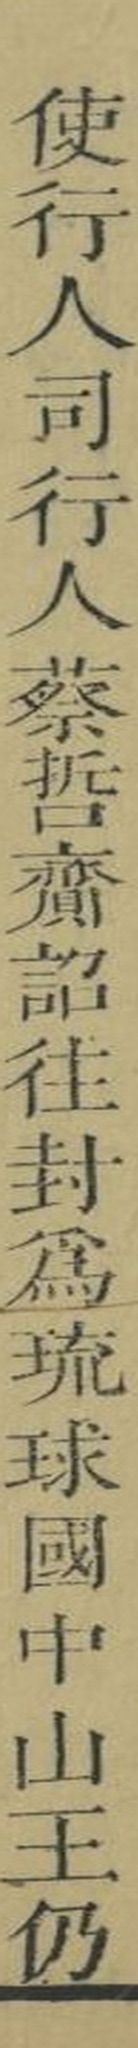使行人司行人蔡哲齎詔往封為琉球国中山王仍
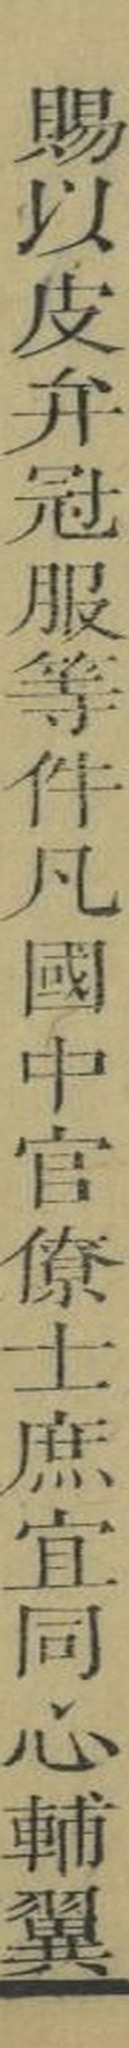賜以皮弁冠服等件凡国中官僚士庶宜同心輔翼
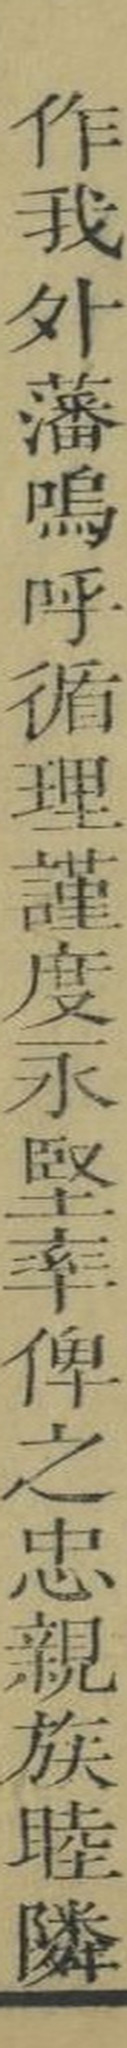作我外藩嗚呼循理謹度永堅率俾之忠親族睦隣
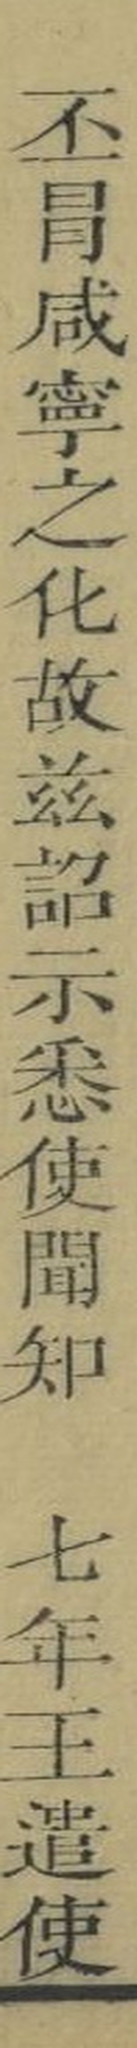丕冐咸寧之化故茲詔示悉使聞知七年王遣使
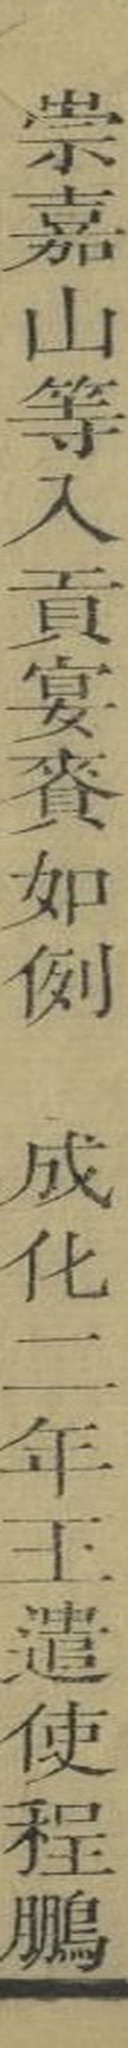崇嘉山等入貢宴賚如例成化二年王遣使程鵬
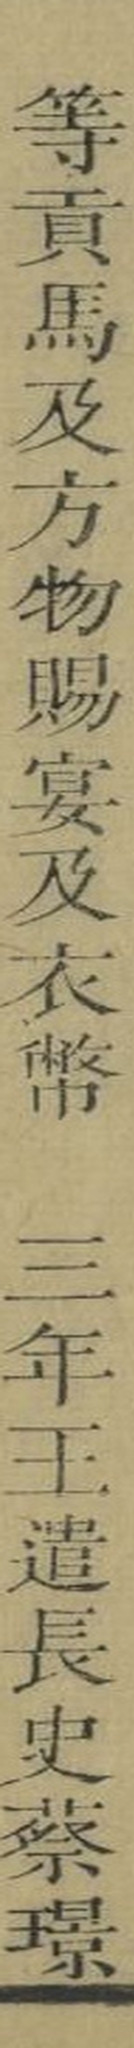等貢馬及方物賜宴及衣幣三年王遣長史蔡璟
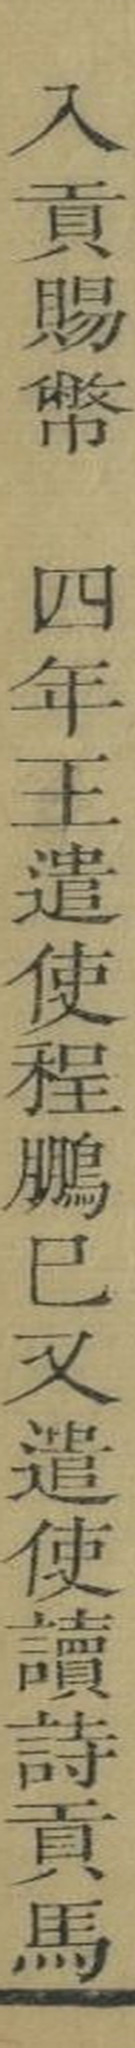入貢賜幣四年王遣使程鵬巳又遣使読詩貢馬

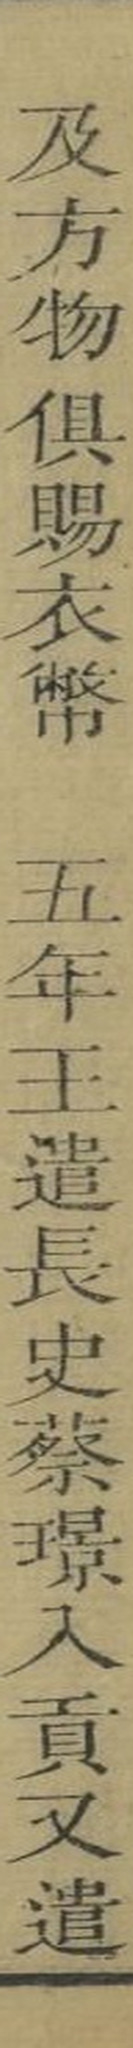及方物俱賜衣幣五年王遣長史蔡璟入貢又遣
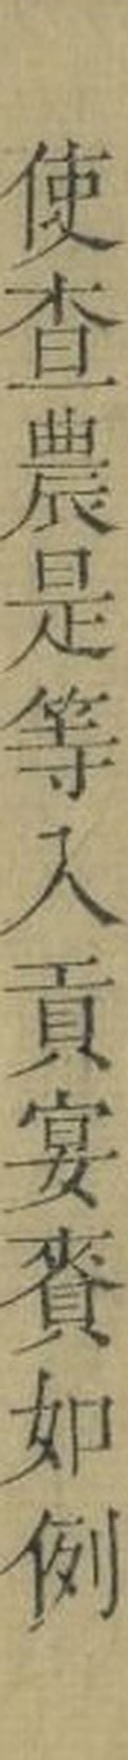使査農是等入貢宴賚如例
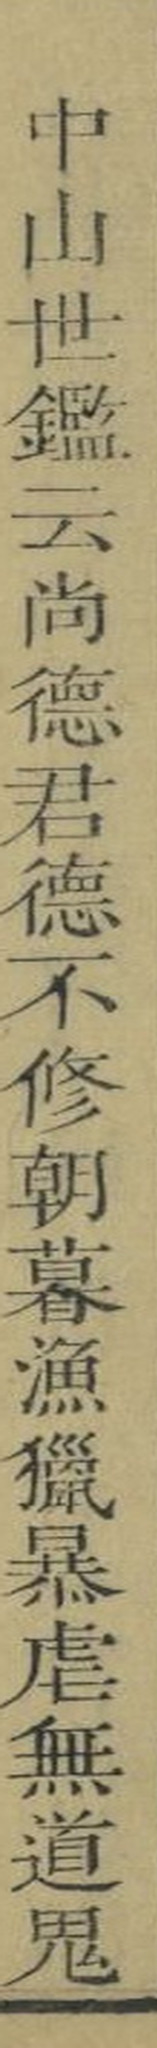中山世鑑云尚徳君徳不修朝暮漁猟暴虐無道鬼
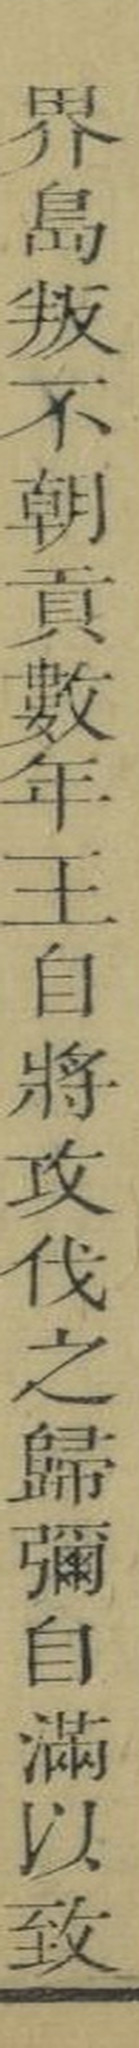界島叛不朝貢数年王自将攻伐之帰弥自満以致
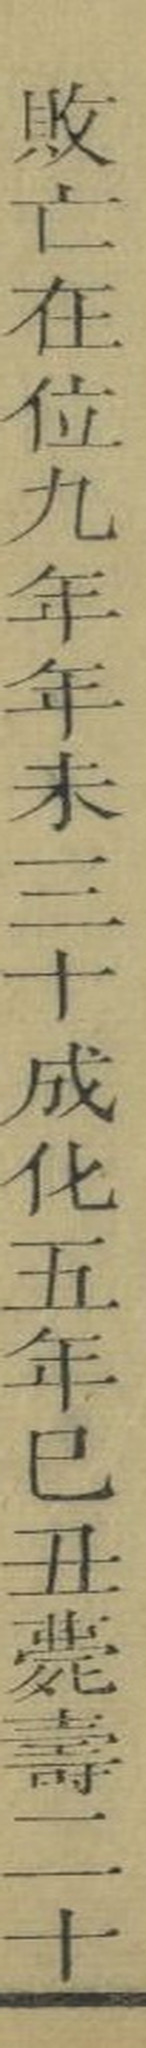敗亡在位九年年未三十成化五年巳丑薨寿二十
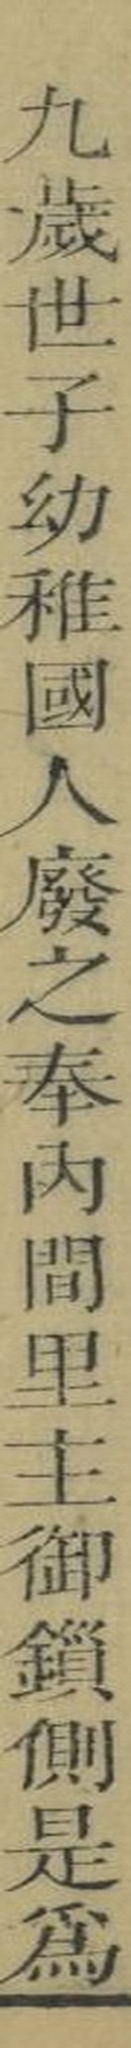九歳世子幼稚国人廃之奉内間里主御鎖側是為
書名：中山伝信録 巻三
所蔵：University of the Ryukyus Library
